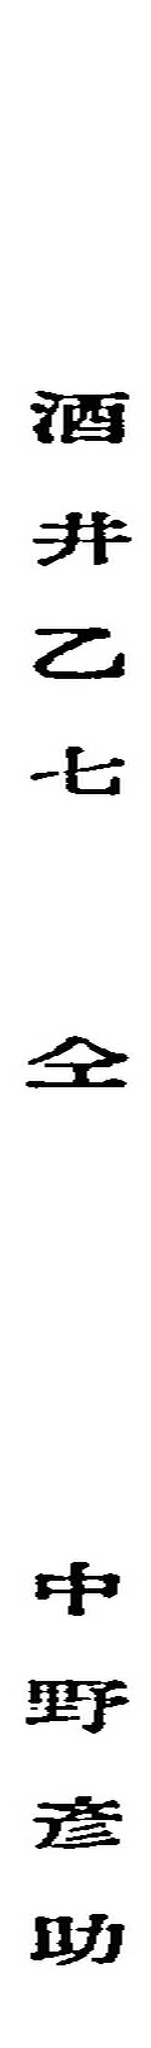仝酒井乙七仝中野彦助
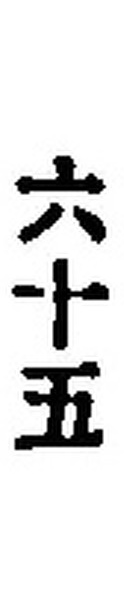六十五

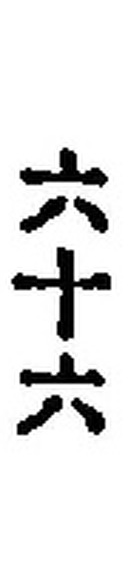六十六
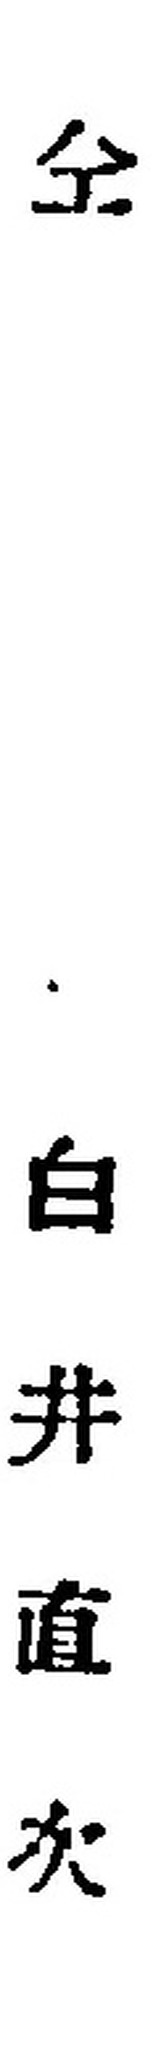仝白井直次
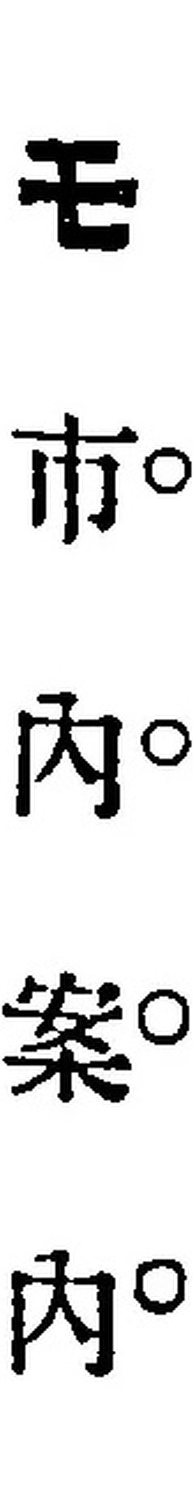モ市内案内
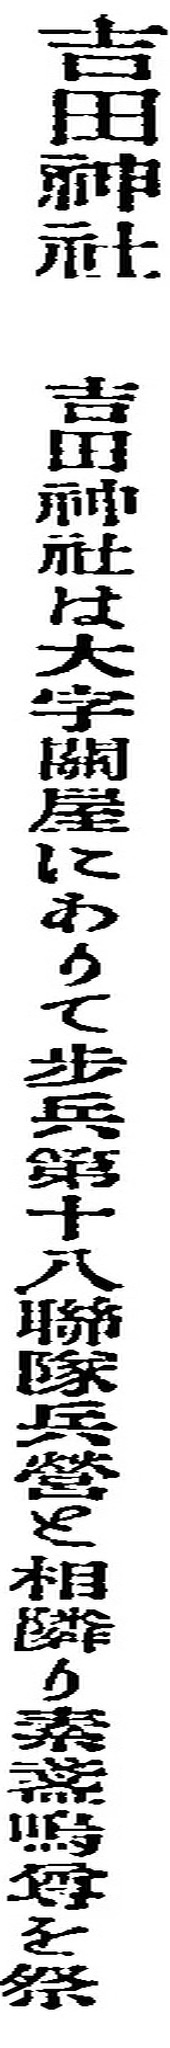吉田神社吉田神社は大字關屋にありて歩兵第十八聯隊兵營と相隣り素盞嗚尊を祭
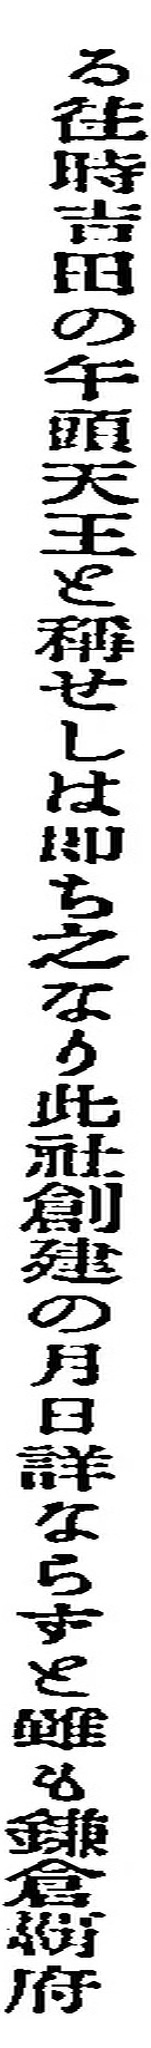る往時吉田の午頭天王と稱せしは即ち之なり此社創建の月日詳ならずと雖も鎌倉覇府
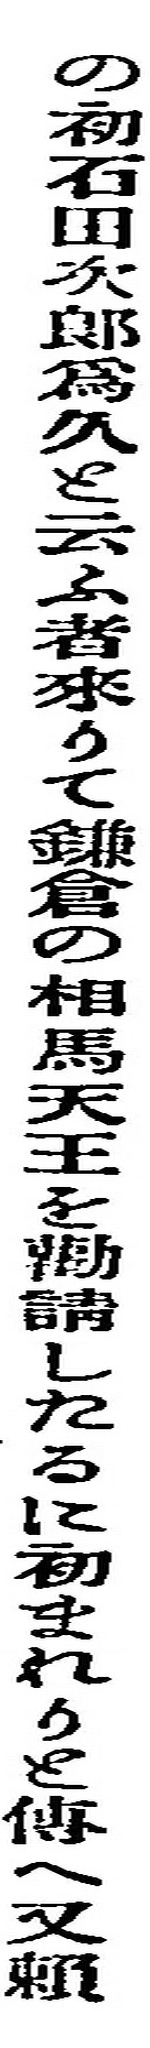の初石田次郞爲久と云ふ者來りて鎌倉の相馬天王を勸請したるに初まれりと傳へ又賴
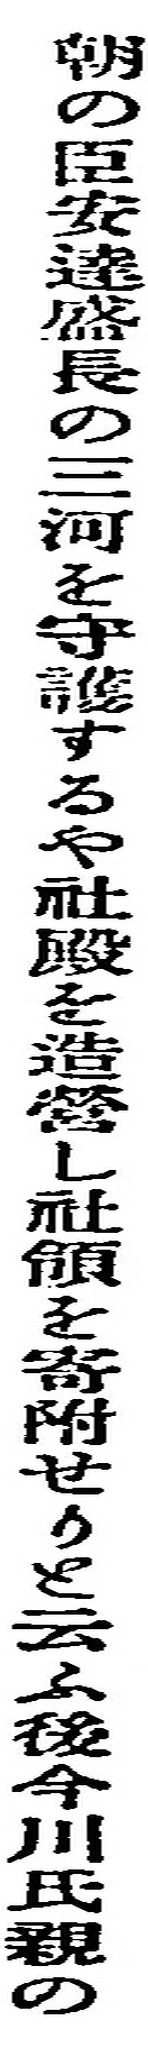朝の臣安達盛長の三河を守護するや社殿を造營し社領を寄附せりと云ふ後今川氏親の
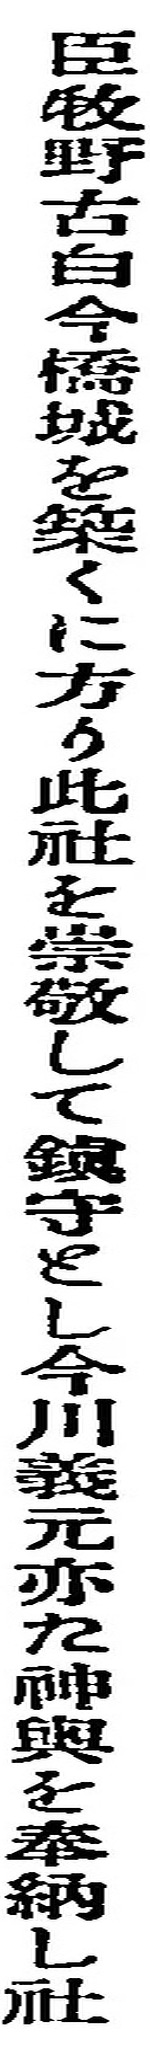臣牧野古白今橋城を築くに方り此社を崇敬して鎭守とし今川義元亦た神輿を奉納し社
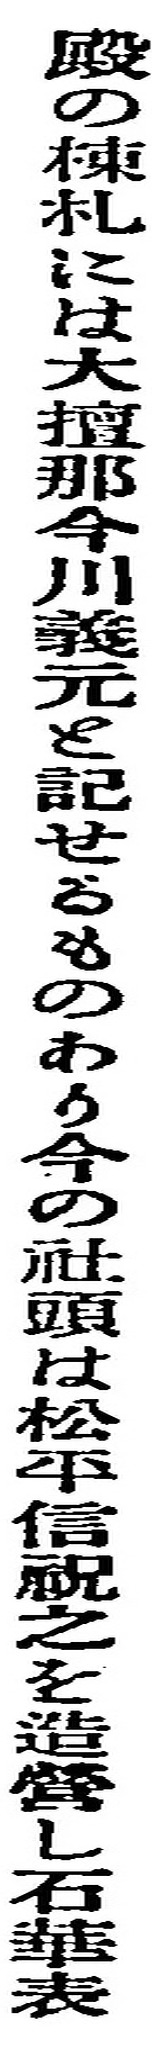殿の棟札には大擅那今川義元と記せるものあり今の社頭は松平信祝之を造營し石華表
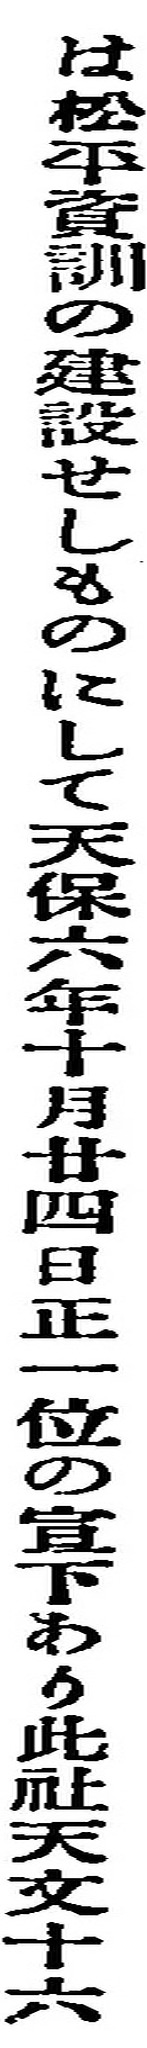は松平資訓の建設せしものにして天保六年十月廿四日正一位の宣下あり此社天文十六
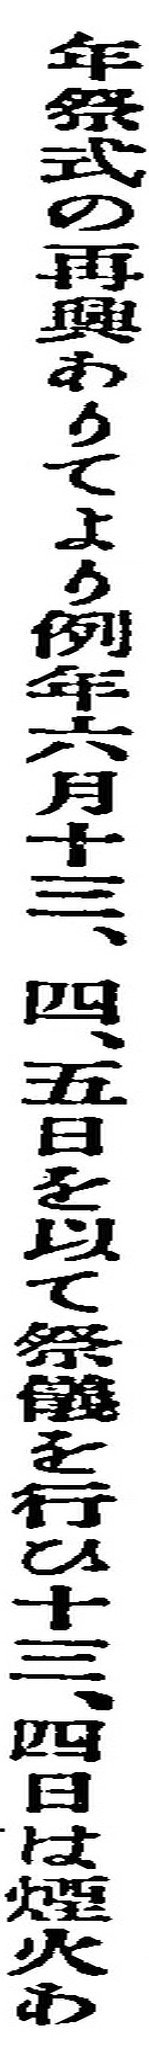年祭式の再興ありてより例年六月十三、四、五、を以て祭儀を行ひ十三、四日は煙火あ
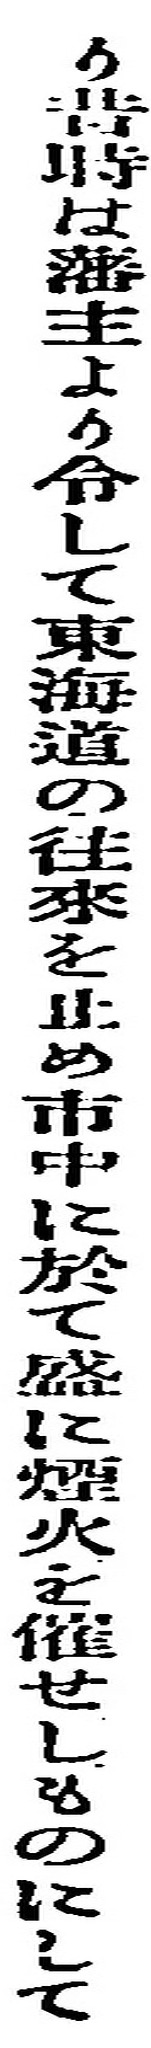り昔時は藩主より令して東海道の往來を止め市中に於て盛に煙火を催せしものにして
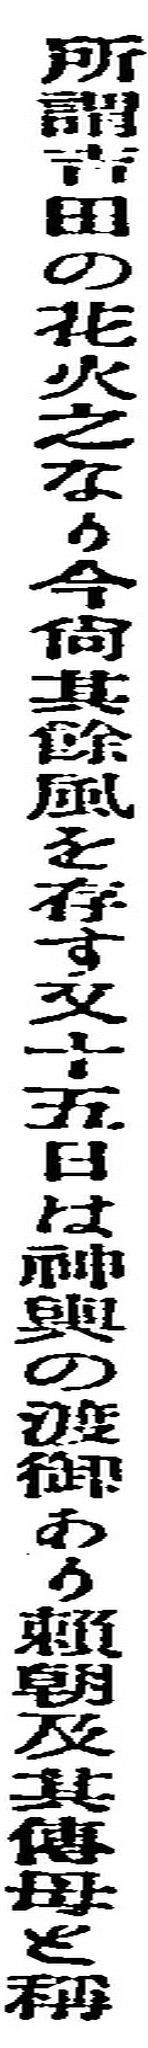所謂吉田の花火之なり今尚其餘風を存す又十五日は神輿の渡御あり賴朝及其傳母と稱
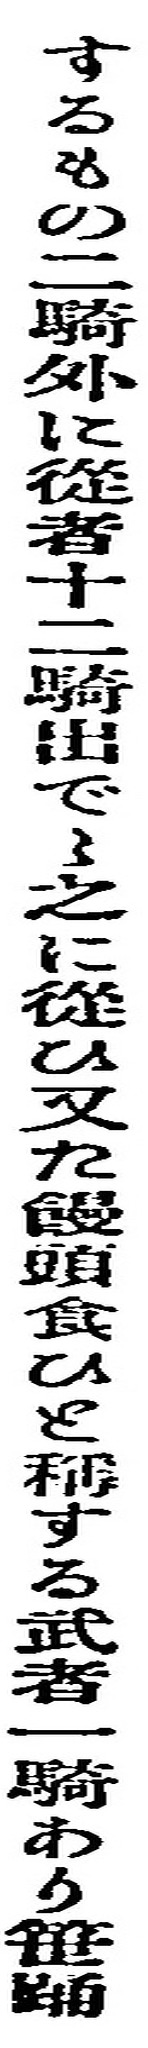するもの二騎外に從者十二騎出でゝ之に從ひ又た饅頭食ひと稱する武者一騎あり笹踊
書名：豊橋志要
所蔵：国立国会図書館 National Diet Library, JAPAN
